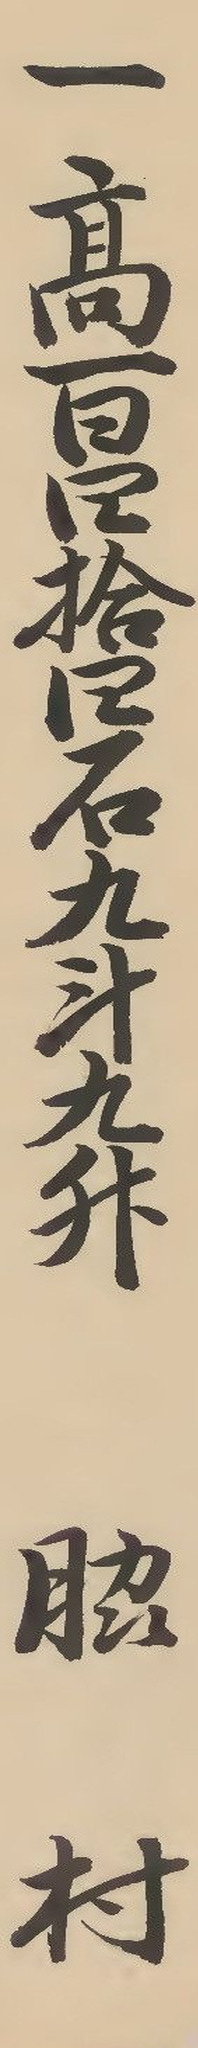一高百四拾四石九斗九升脇村
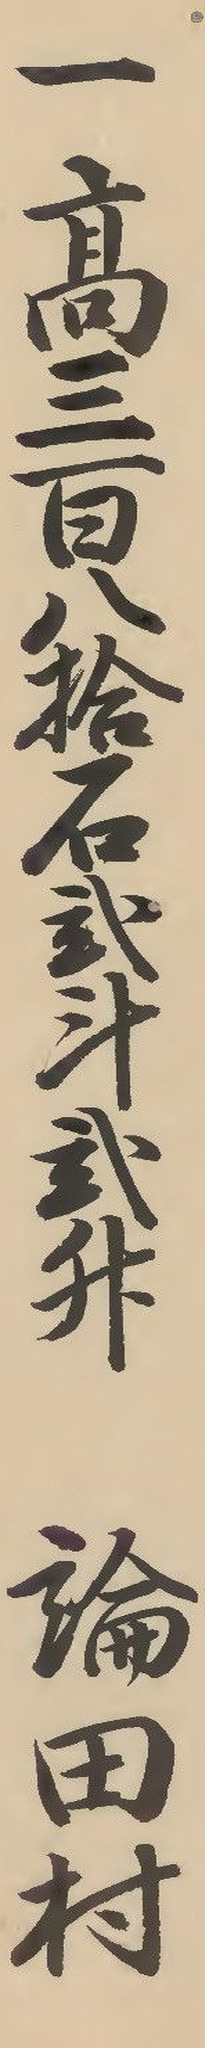一高三百八拾石弐斗弐升論田村

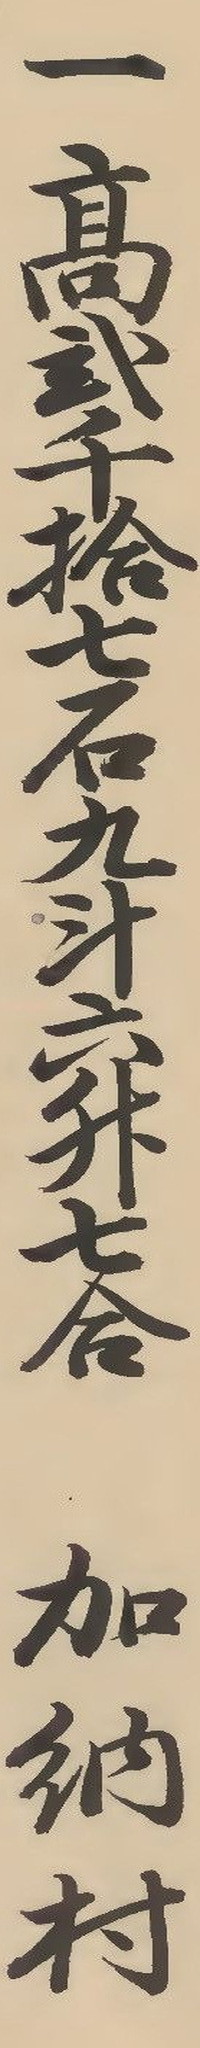一高弐千拾七石九斗六升七合加納村
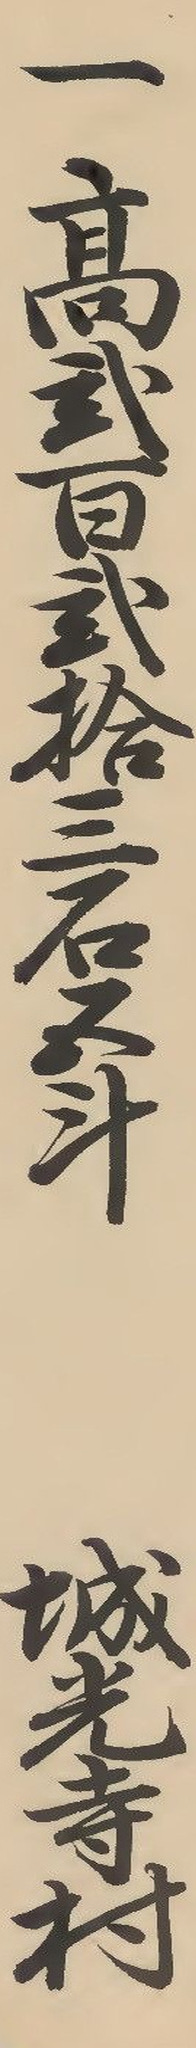一高弐百弐拾三石五斗城光寺村
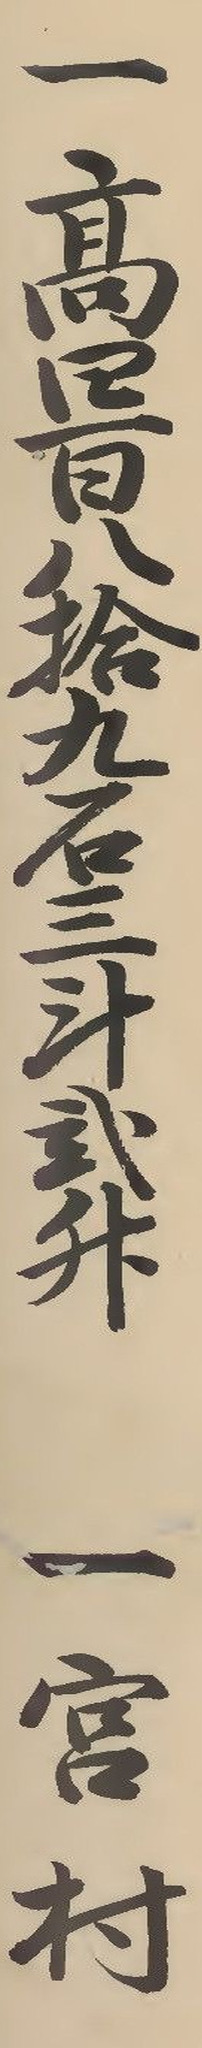一高四百八拾九石三斗弐升一宮村

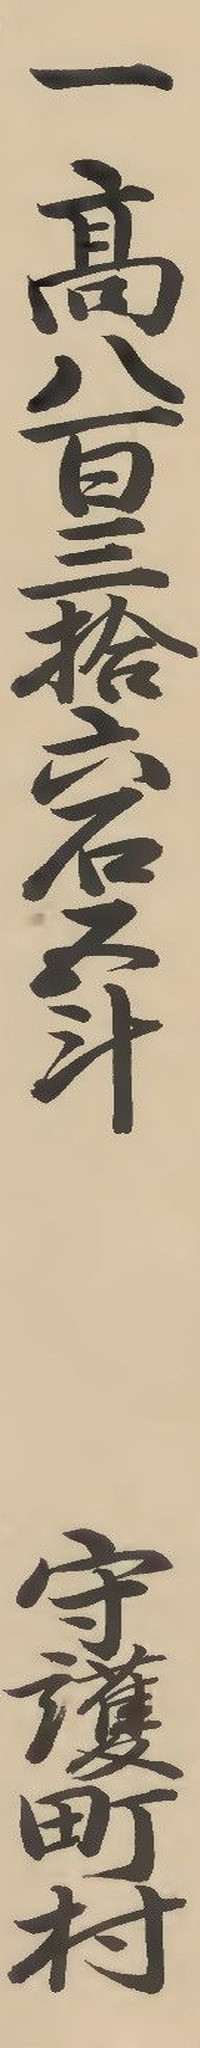一高八百三拾六石五斗守護町村
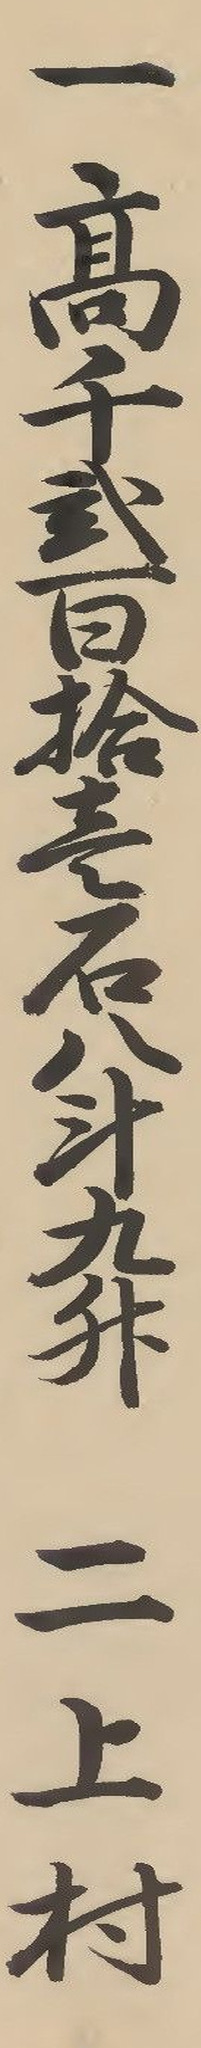一高千弐百拾壱石八斗九升二上村
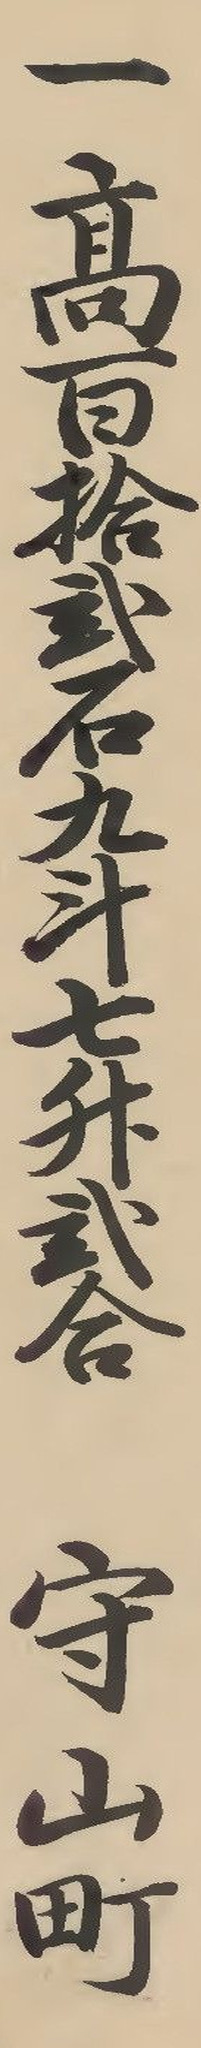一高百拾弐石九斗七升弐合守山町
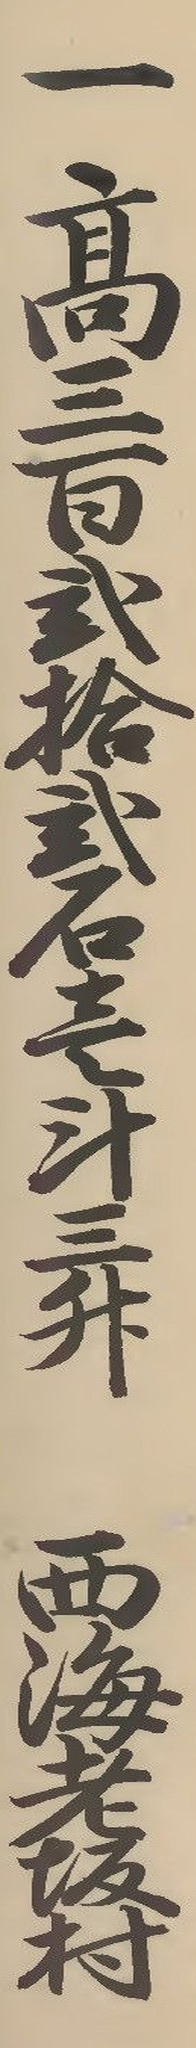一高三百弐拾弐石壱斗三升西海老坂村
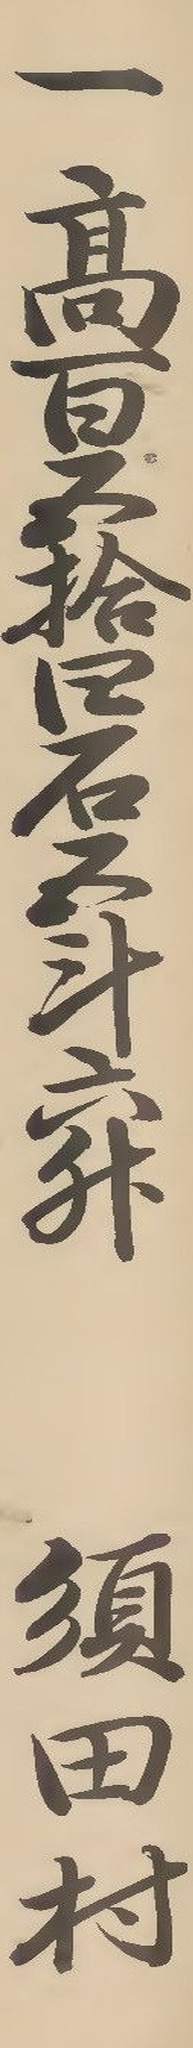一高百五拾四石五斗六升須田村
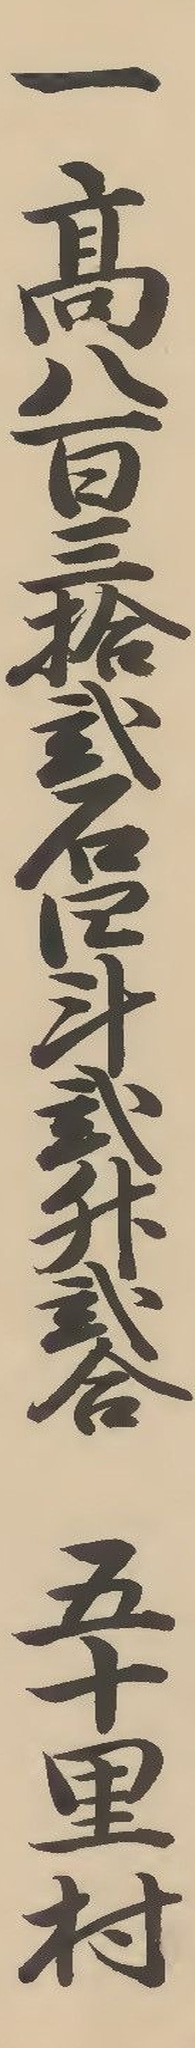一高八百三拾弐石四斗弐升弐合五十里村
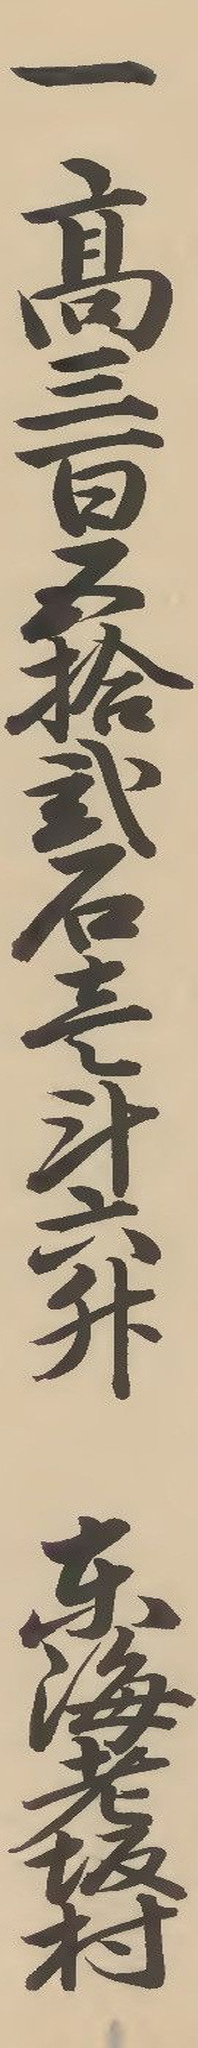一高三百五拾弐石壱斗六升東海老坂村

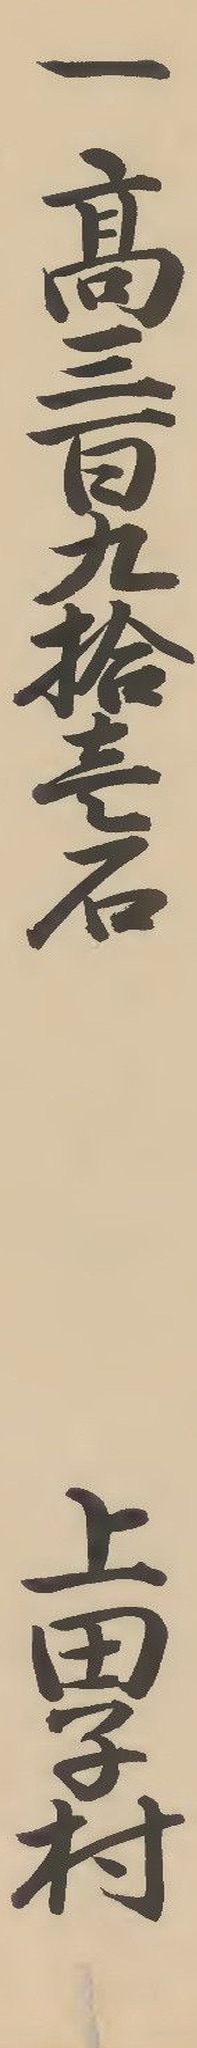一高三百九拾壱石上田子村
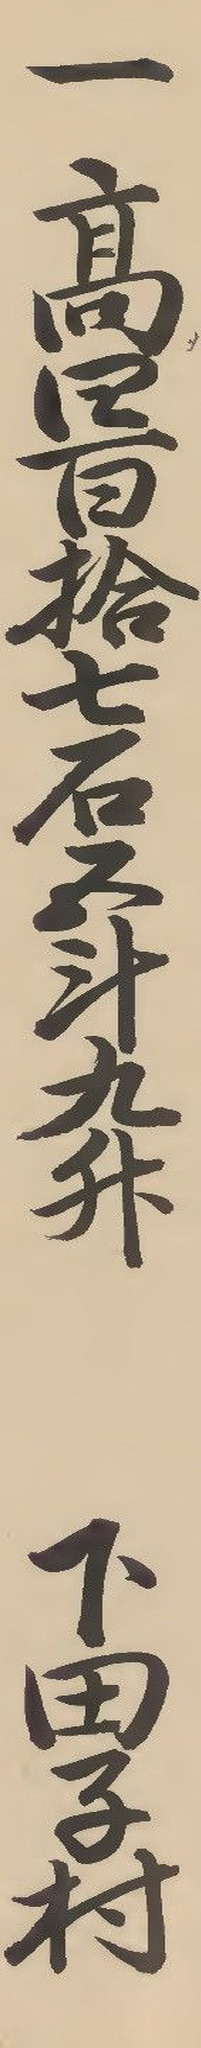一高四百拾七石五斗九升下田子村
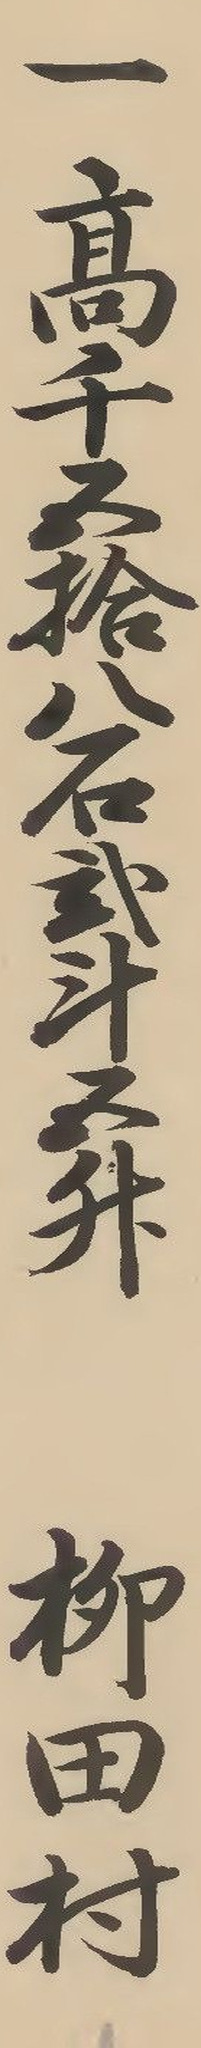一高千五拾八石弐斗五升柳田村
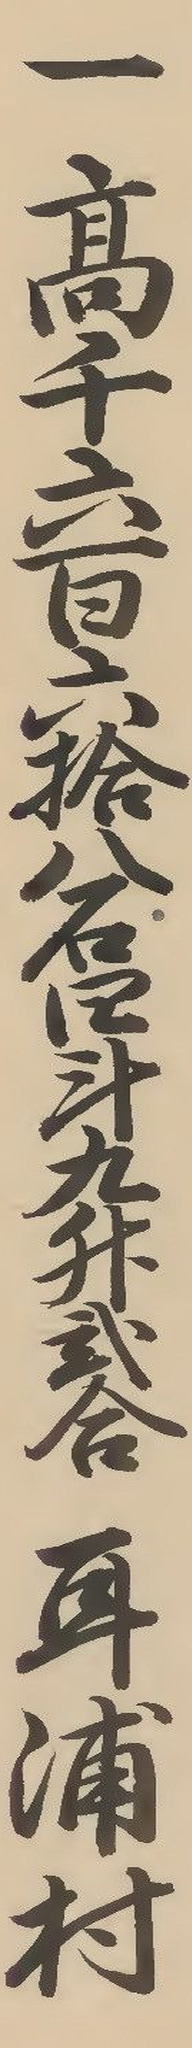一高千六百六拾八石四斗九升弐合耳浦村
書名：越中国郷帳
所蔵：国立公文書館 National Archives of Japan
